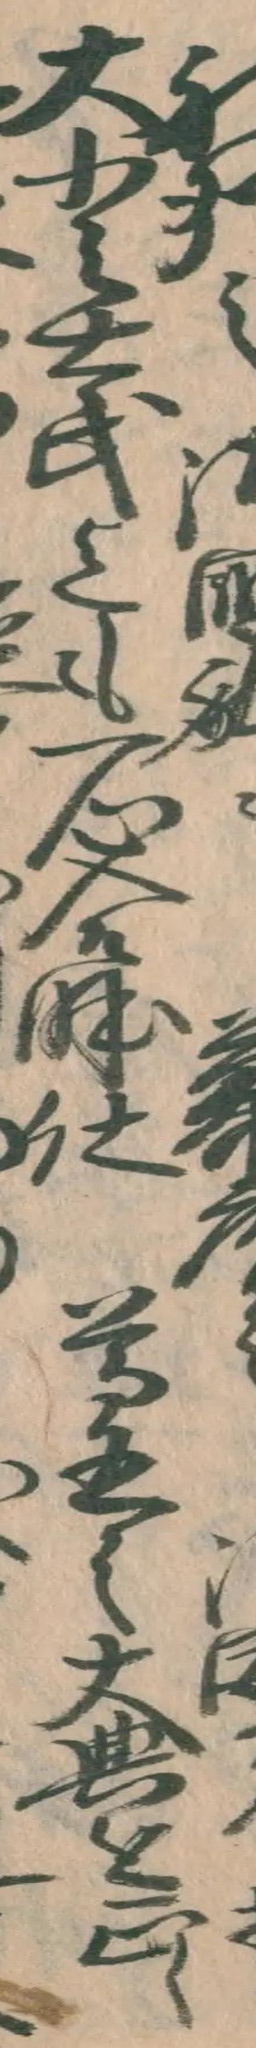大小之士民迄も一心合体仕尊王之大典を正し
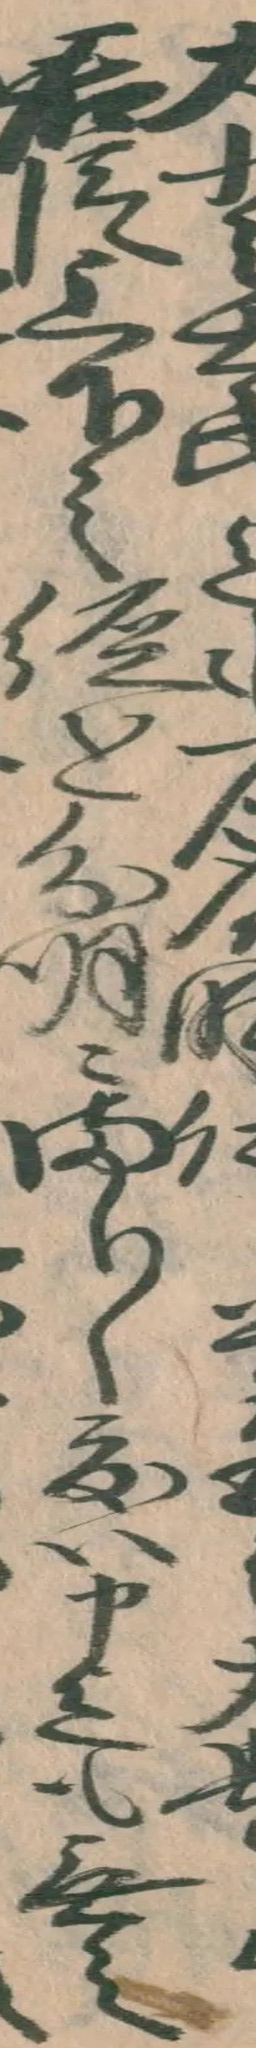君臣上下之徑を分明ニまし〳〵度ハ申迄も無之
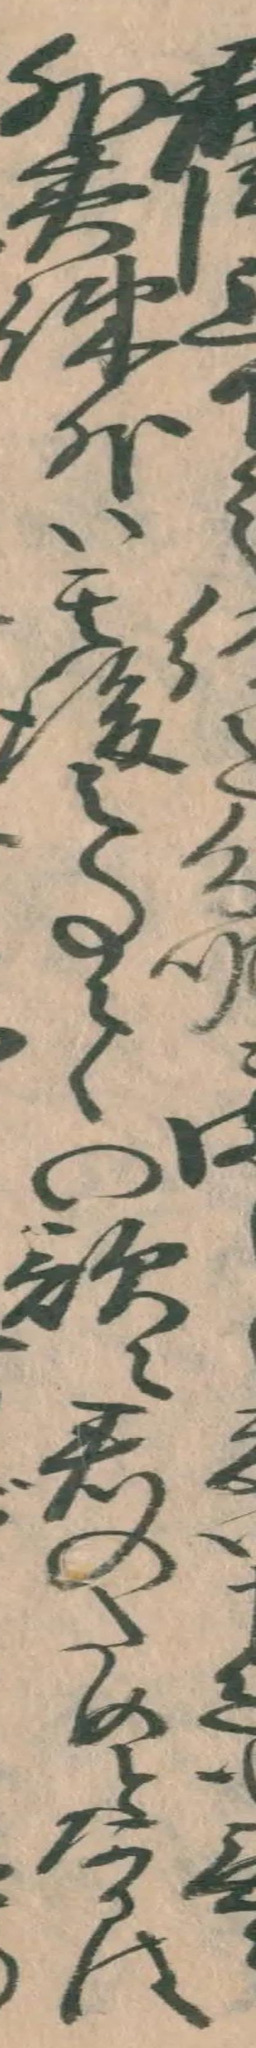外夷疎外ハ其後之事ニ候〇歌ニ君のためとあるは
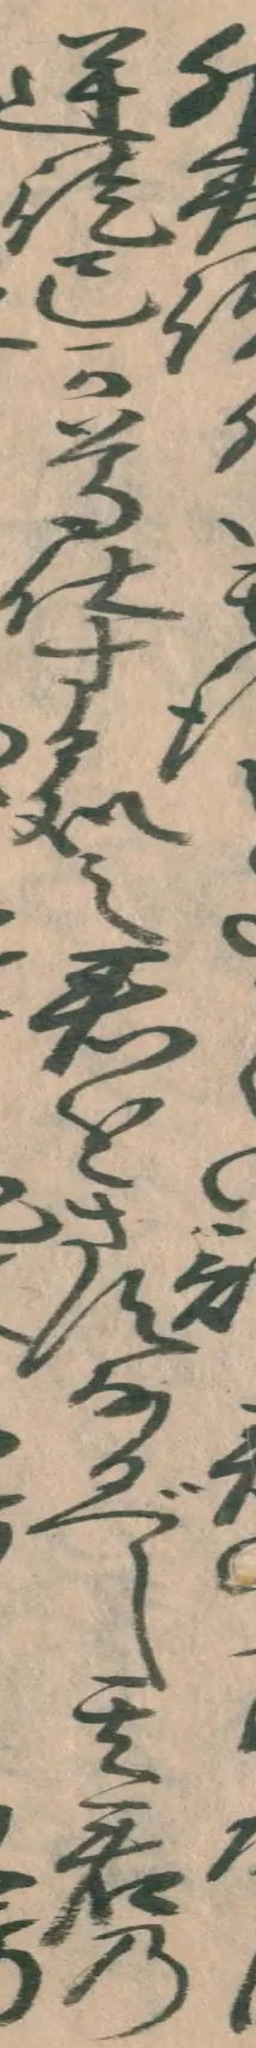逆徒己か尊仕する処之君をさすなるべし其君の
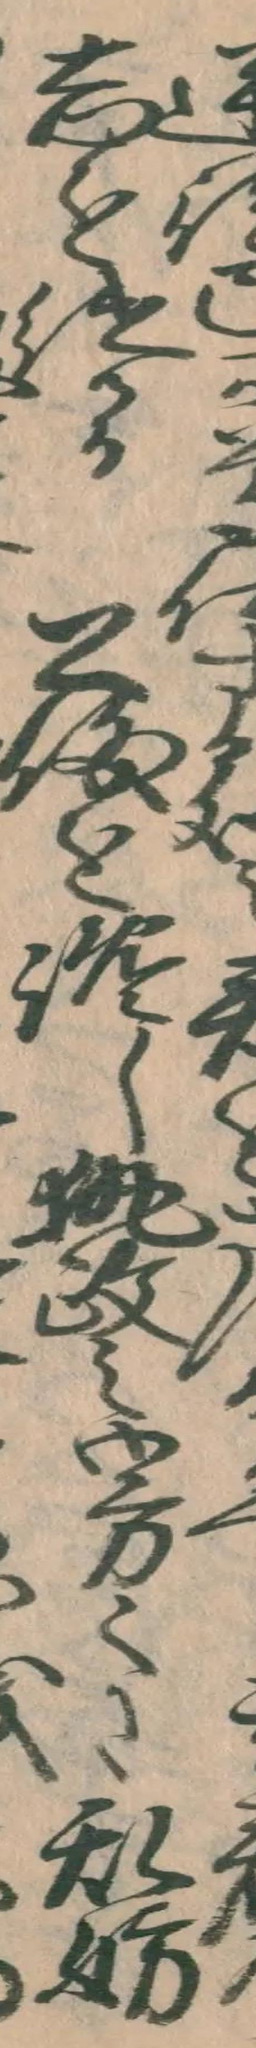志を継候而公儀を讒し執政之御方々に乱妨
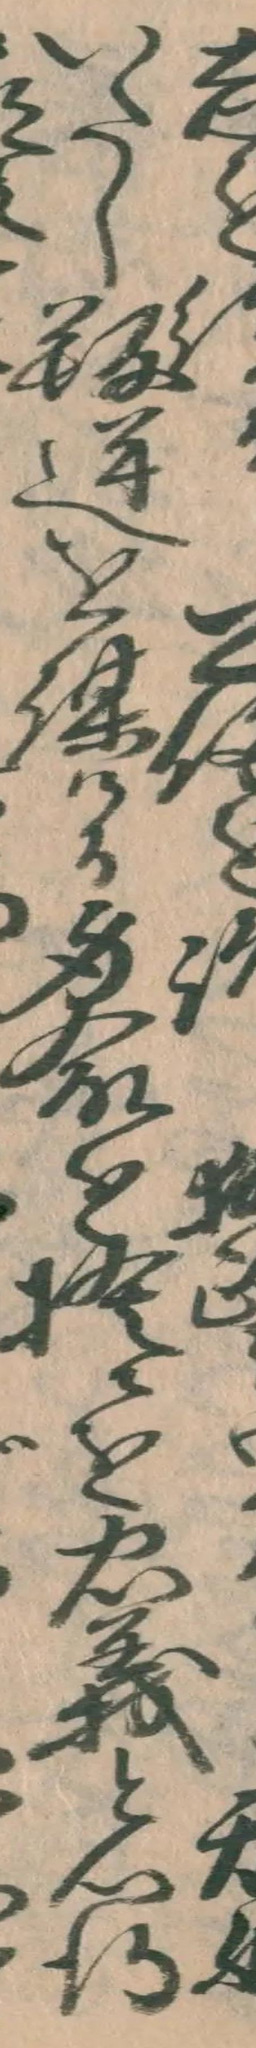いたし叛逆を謀候而身命を捨ルを忠義と心得
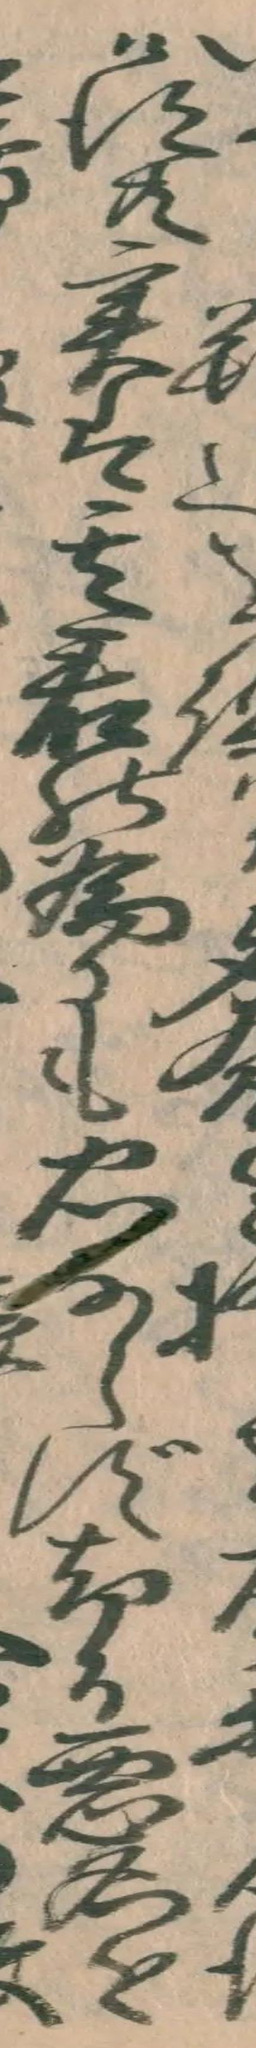候得共実は其君の為にも忠ならず却而悪名を
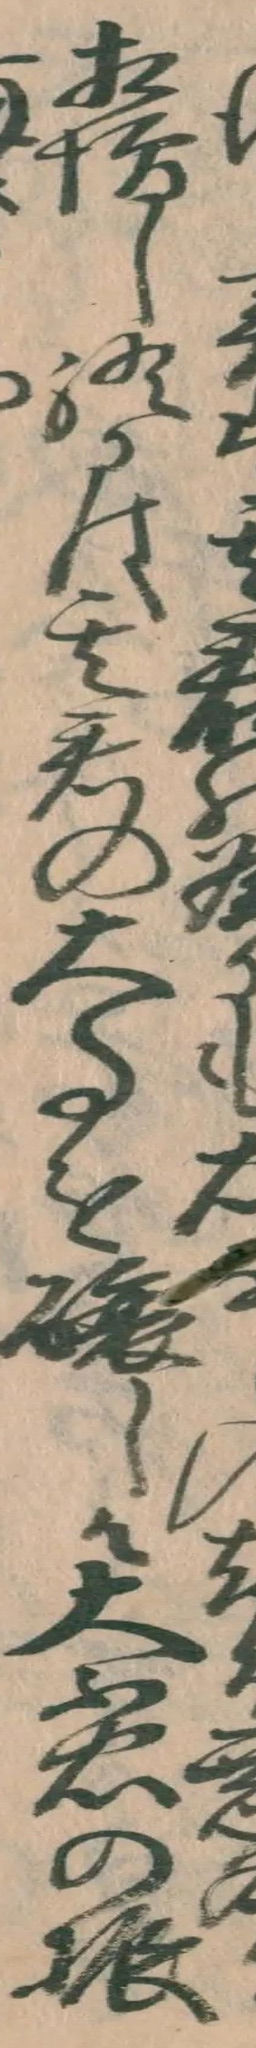相増し終には其君の大事を醸し候大不忠の振
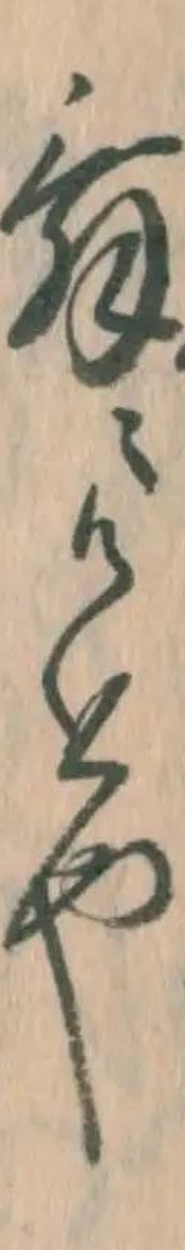舞ニ候とや
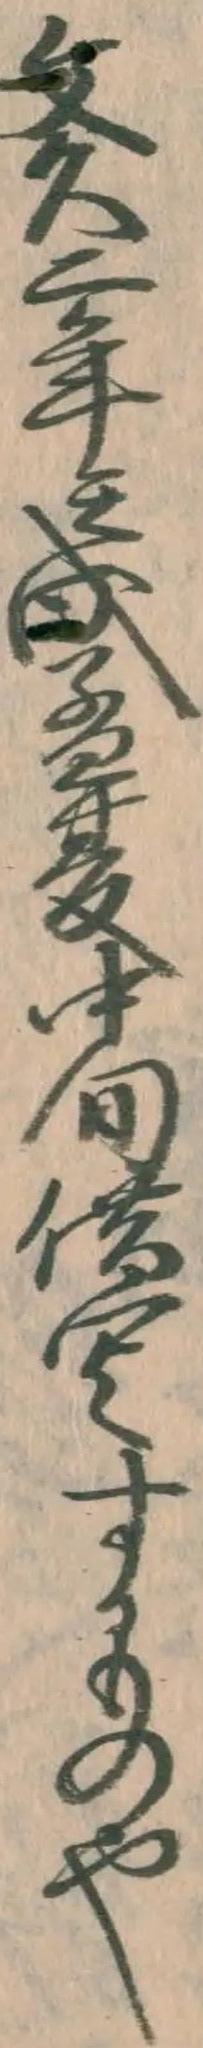文久二年壬戌孟夏中旬借写すものや

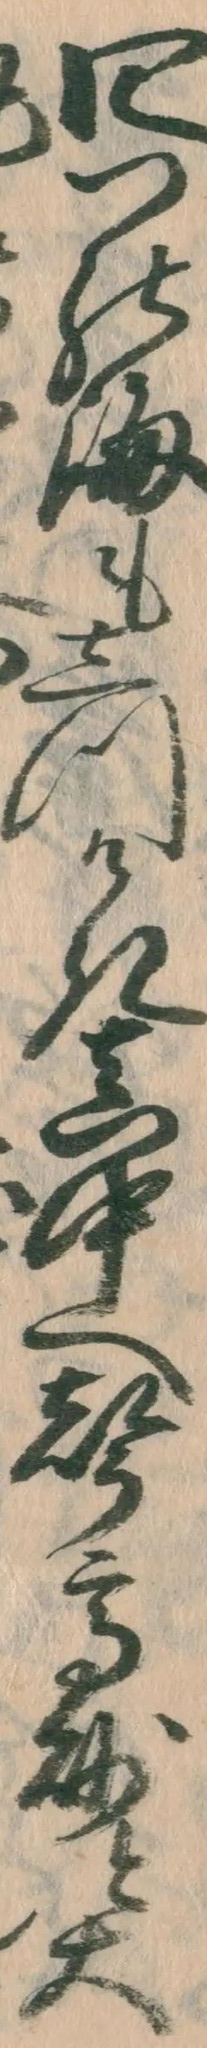四つの海もしつけき真中へ聲高砂と大
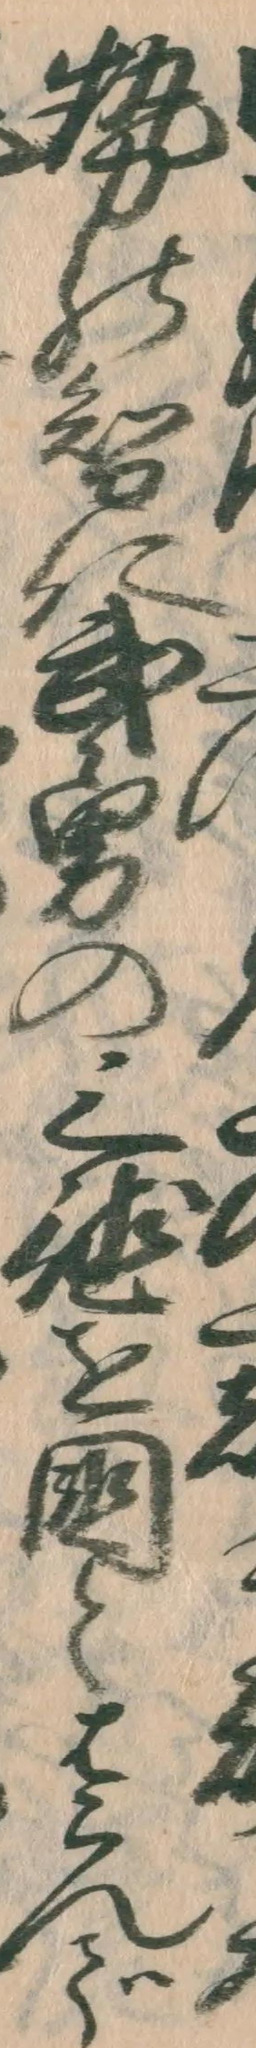勢の智仁武勇の三徳を国にはらんで
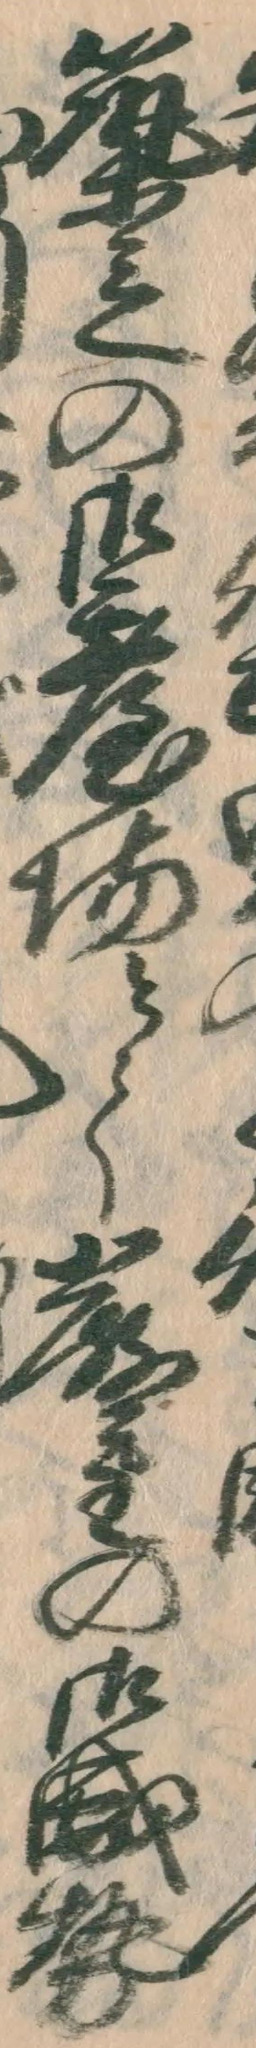築立の御台場とて厳重の御威勢
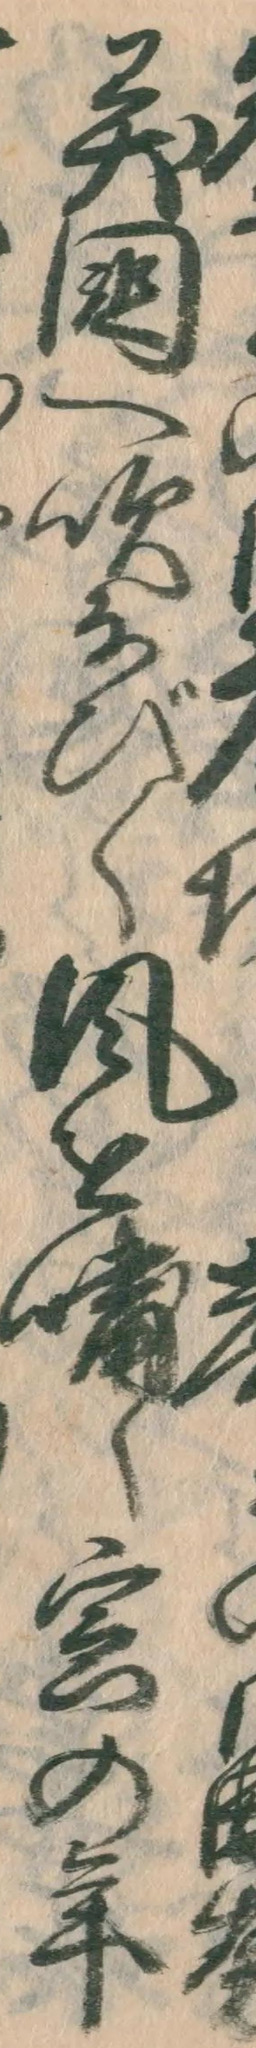異国へ吹なびく風を嘯く寅の年
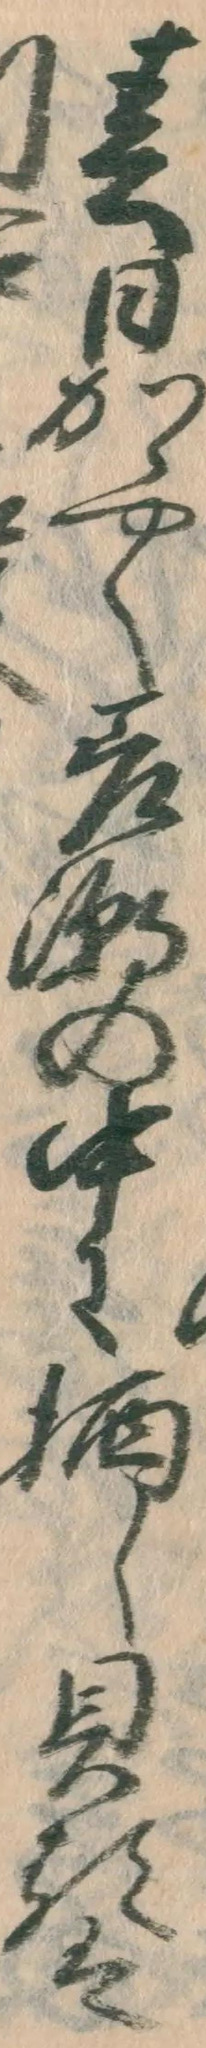春日かゝやく差潮の中に栖し貝類は
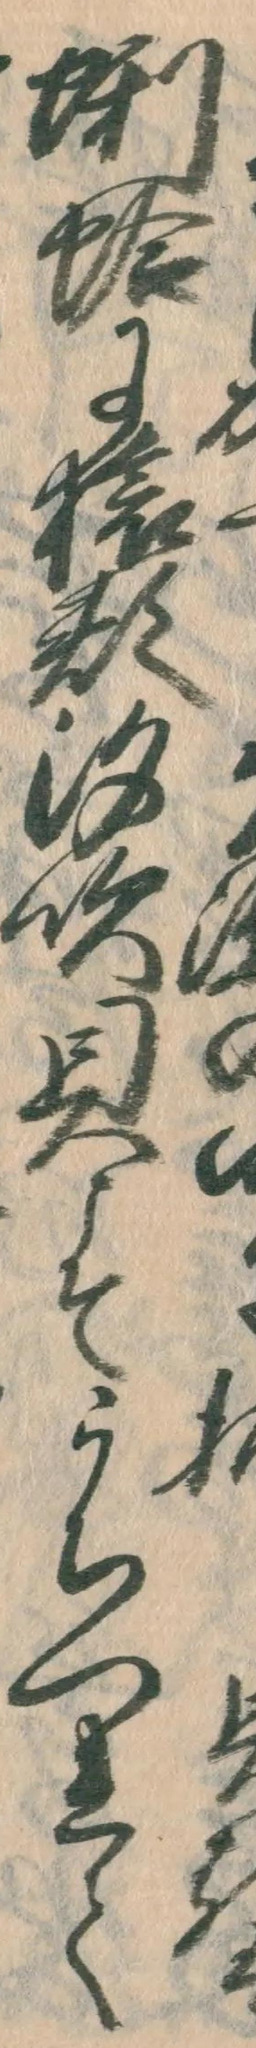蜊蛤に猿頬汐吹貝こそうちつれて
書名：麗斎叢書. 20
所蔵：国立国会図書館 National Diet Library, JAPAN
